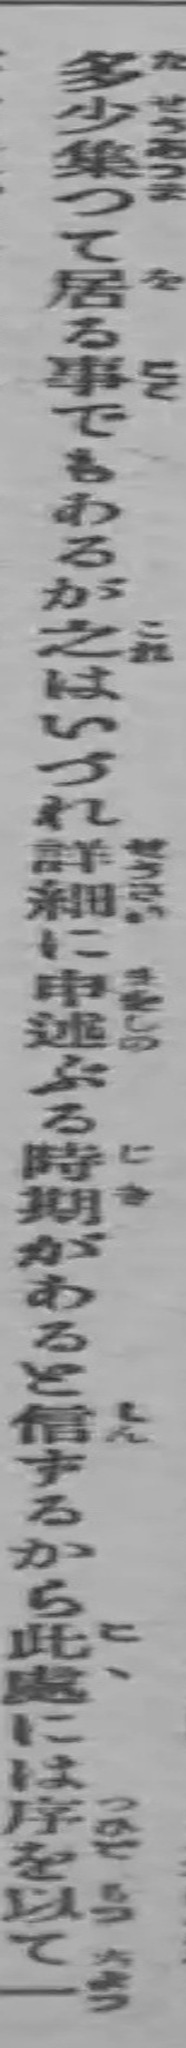多少集つて居る事でもあるが之はいづれ詳細に申述ぶる時期があると信ずるから此処には序を以て一
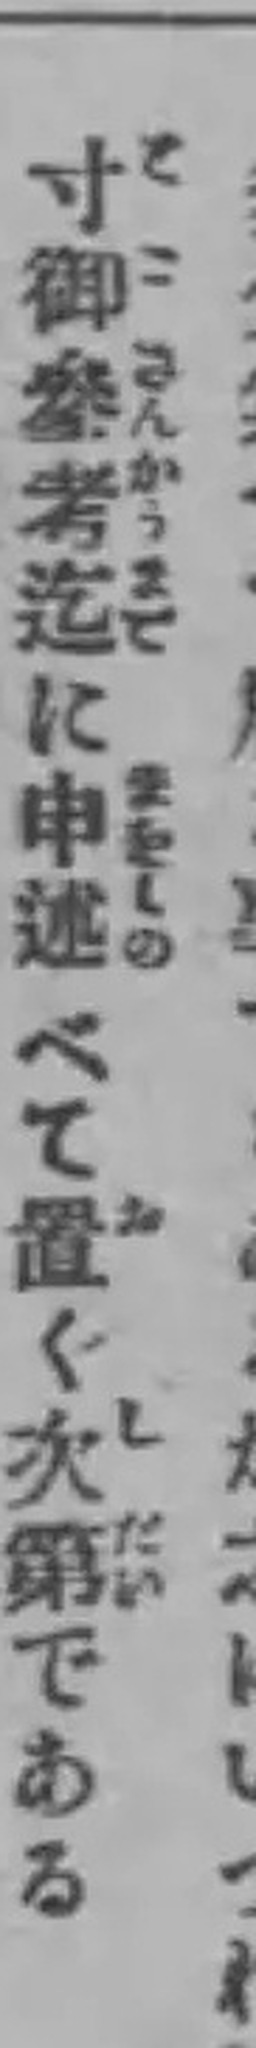寸御参考迄に申述べて置く次第である
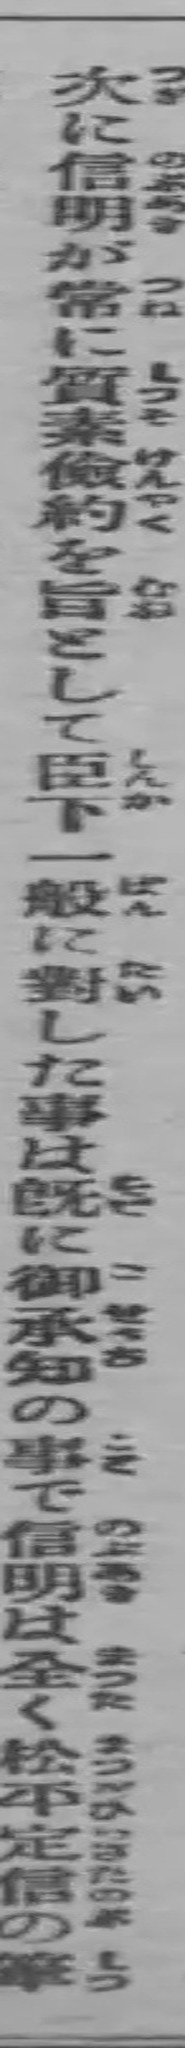次に信明が常に質素倹約を旨として臣下一般に対した事は既に御承知の事で信明は全く松平定信の筆
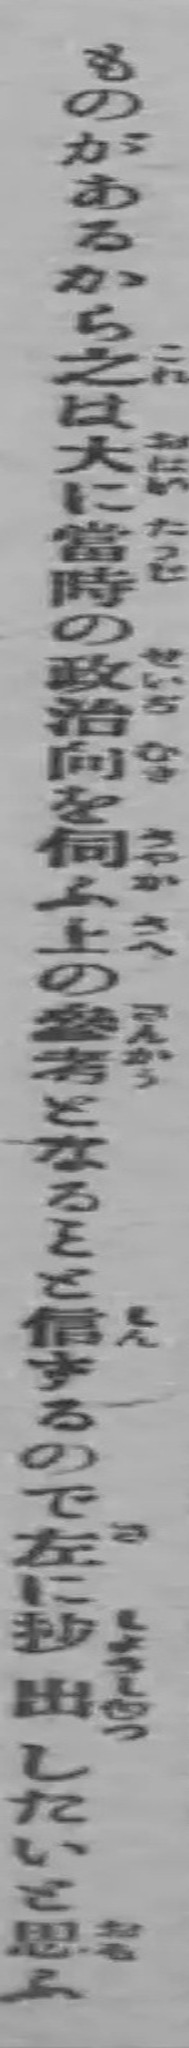ものがあるから之は大に当時の政治向を伺ふ上の参考となることと信ずるので左に抄出したいと思ふめ
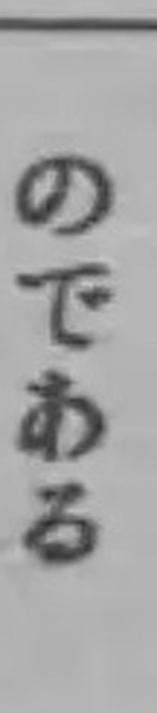のである
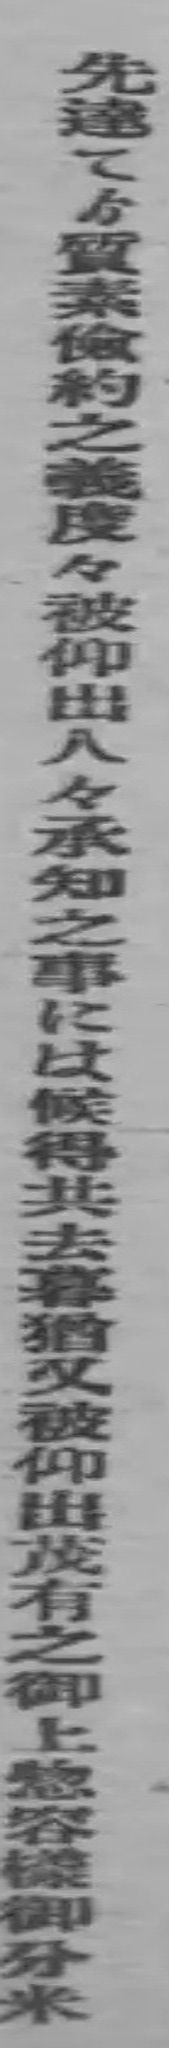先達てゟ質素倹約之義度々被仰出人々承知之事には候得共去暮猶又被仰出茂有之御上御上惣容様御分米
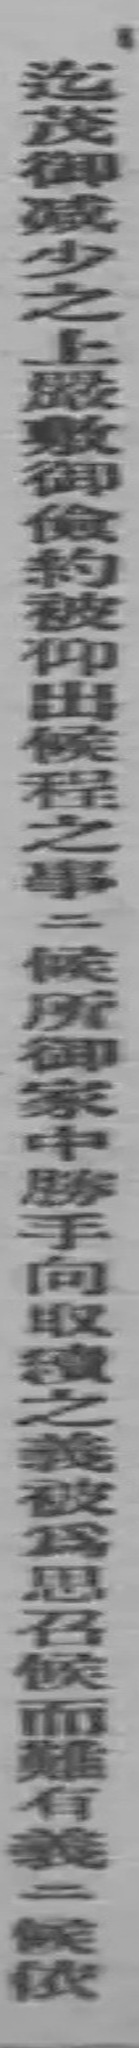迄茂御減少之上厳敷御倹約被仰出候程之事ニ候所御家中勝手向取続之義被為思召候而難有義ニ候依
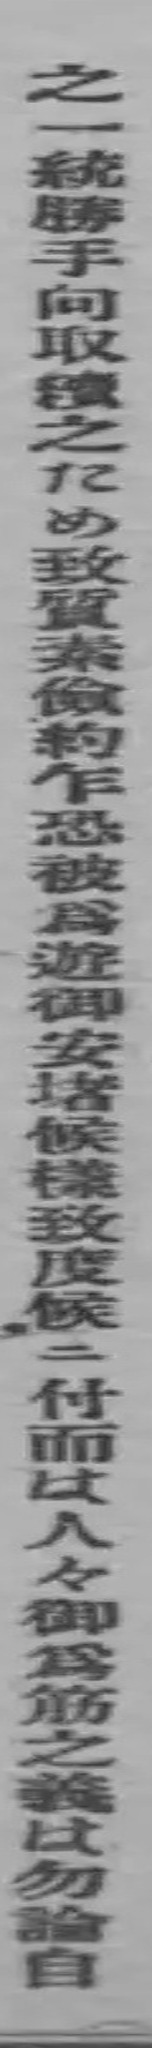之一統勝手向取続之ため致質素倹約乍恐被為遊御安堵候様致度候ニ付而は人々御為筋之義は勿論自
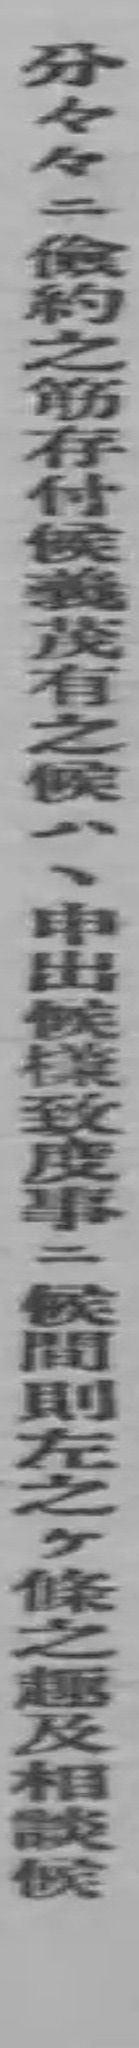分々々ニ倹約之筋存付候義茂有之候ハヽ申出候様致度事ニ候間則左之ケ條之趣及相談候
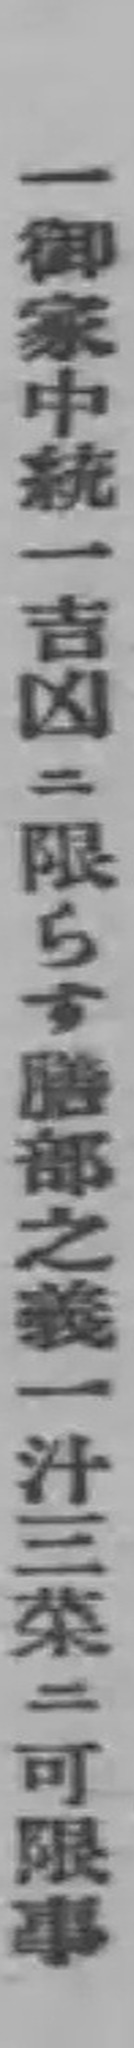一御家中統一吉凶ニ限らす膳部之義一汁三菜ニ可限事
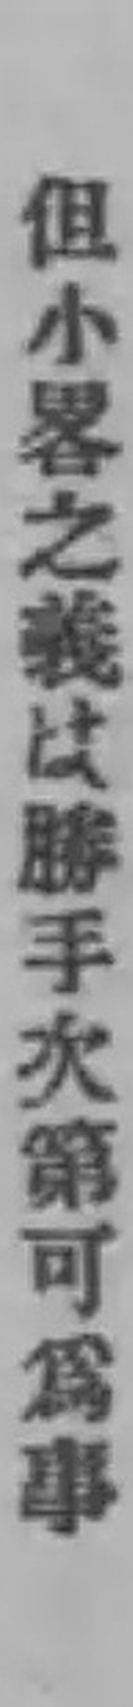但小略之義は勝手次第可為事
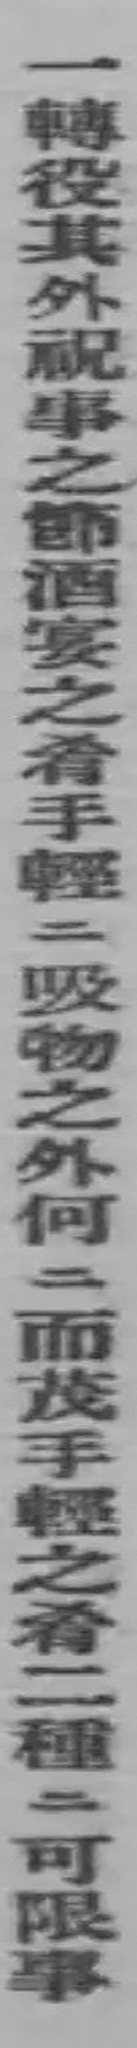一転役其外祝事之節酒宴之肴手軽ニ吸物之外何ニ而茂手軽之肴二種ニ可限事
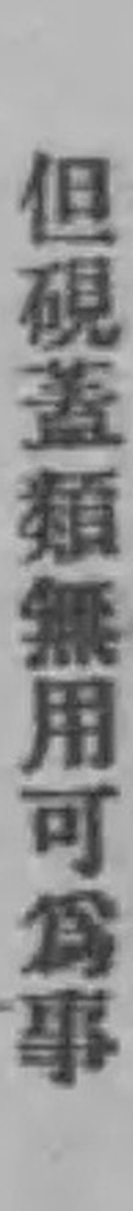但硯蓋類無用可為事
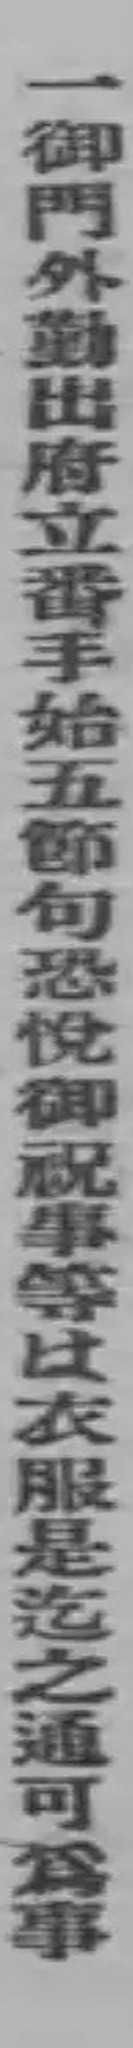一御門外勤出府立番手始五節句恐悦御祝事等は衣服是迄之通可為事
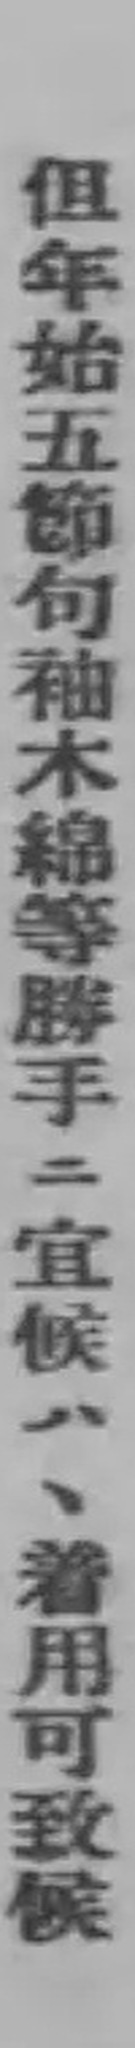但年始五節句袖木綿等勝手ニ宜候ハヽ着用可致候
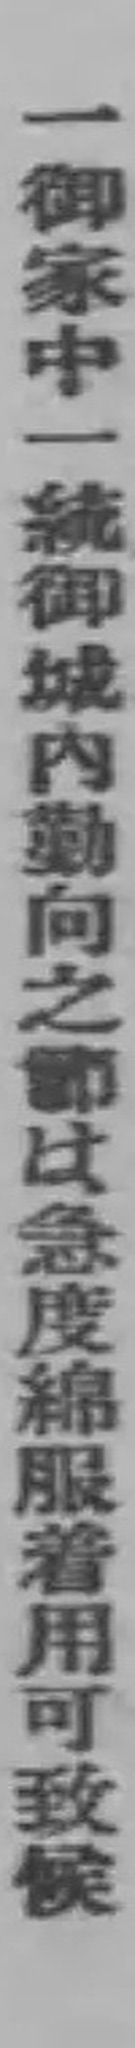一御家中一統御城内勤向之節は急度綿服着用可致候
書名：豊橋市史談
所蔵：国立国会図書館 National Diet Library, JAPAN
